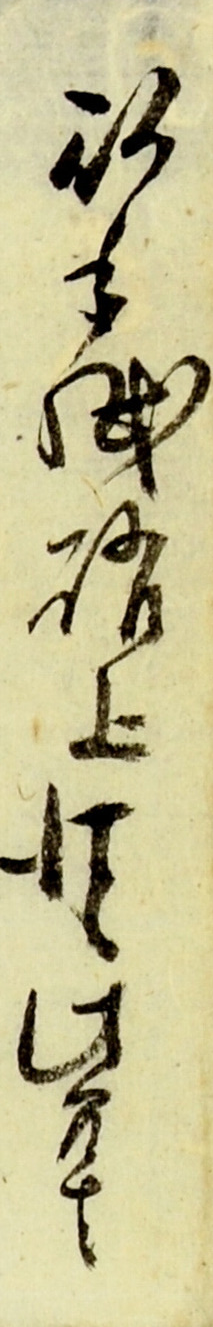以手紙啓上仕候此間は
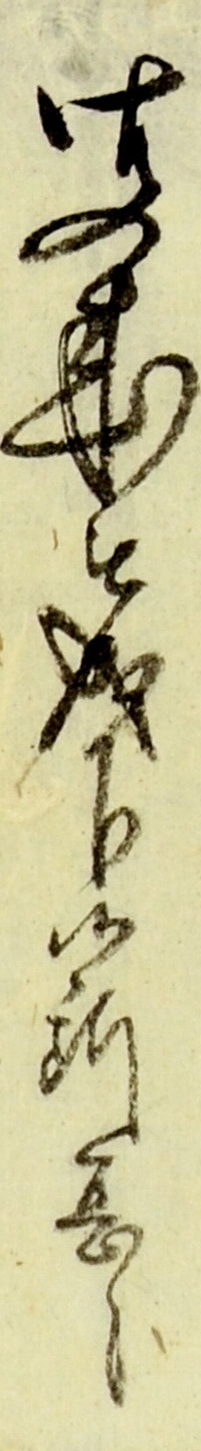御入来被成下候所甚く
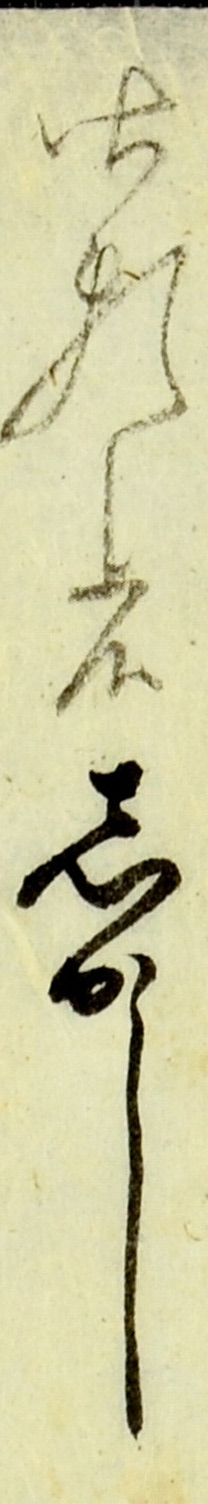御頼申上候しかし
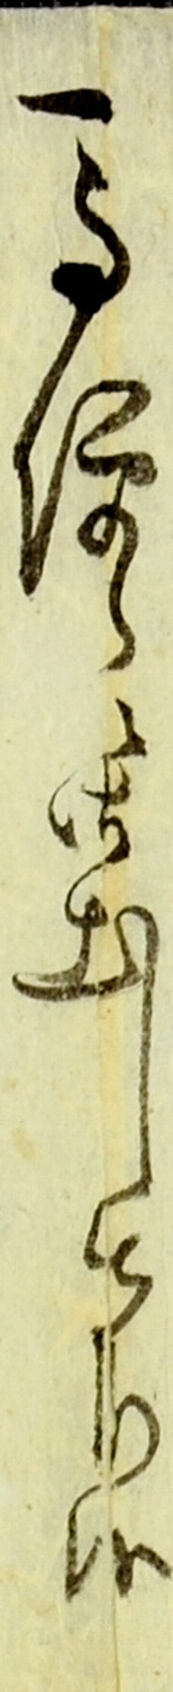馬便りに御出し被下候
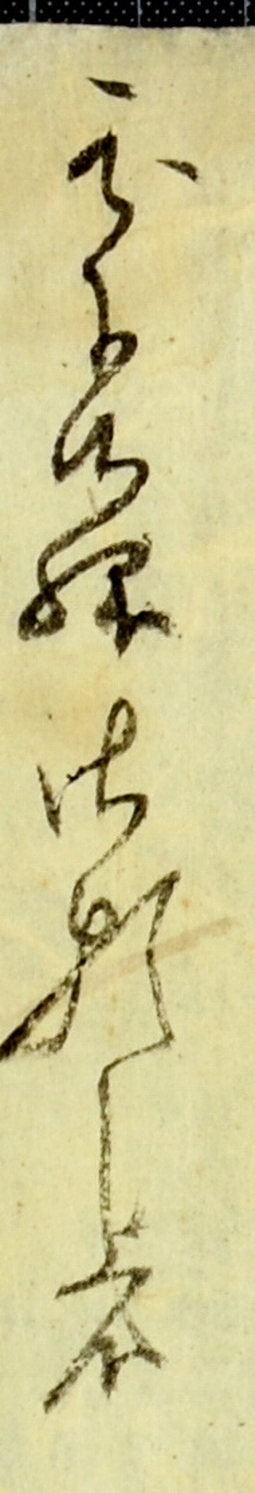可被下候様御頼申上候
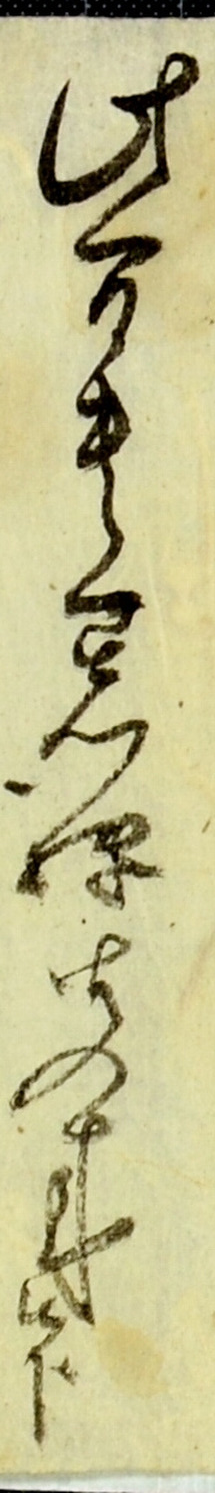此間貴君様御入来被下
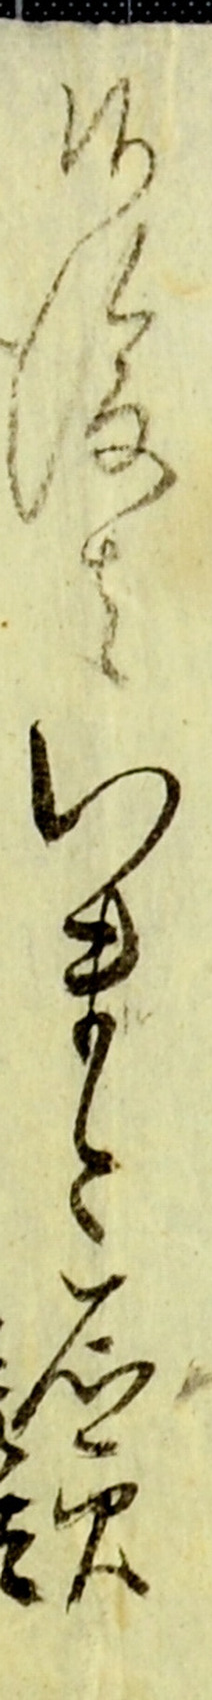候後はいまた石灰
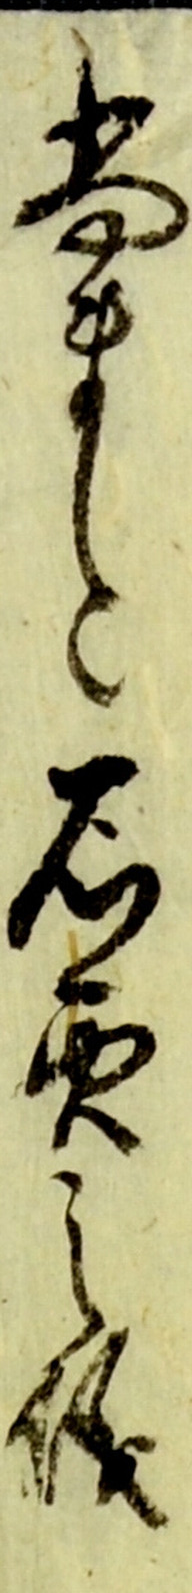尚また石灰之儀
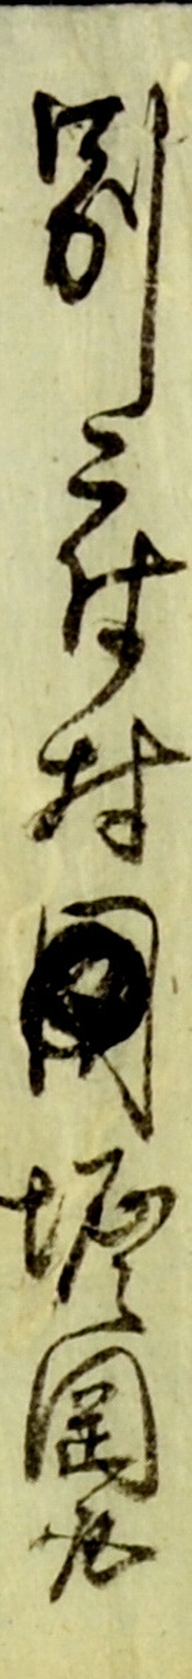別府村堀岡屋
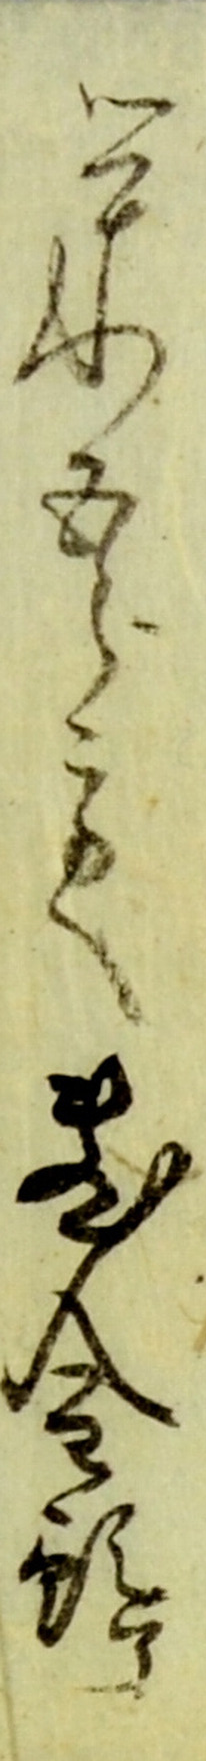栄五郎方へ敷金預ヶ

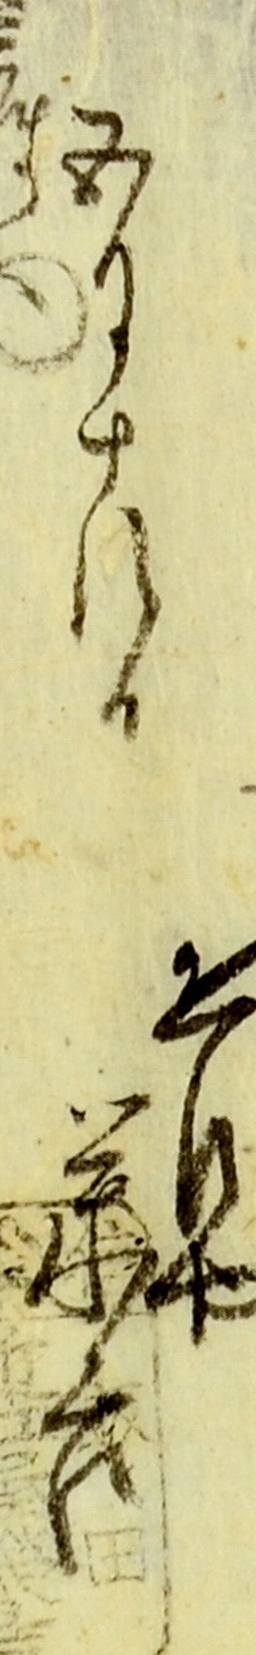五月十八日栄吉㊞
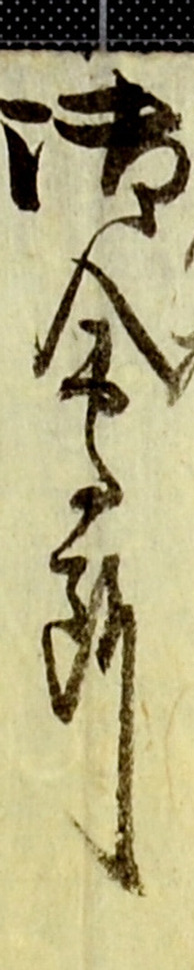御会所

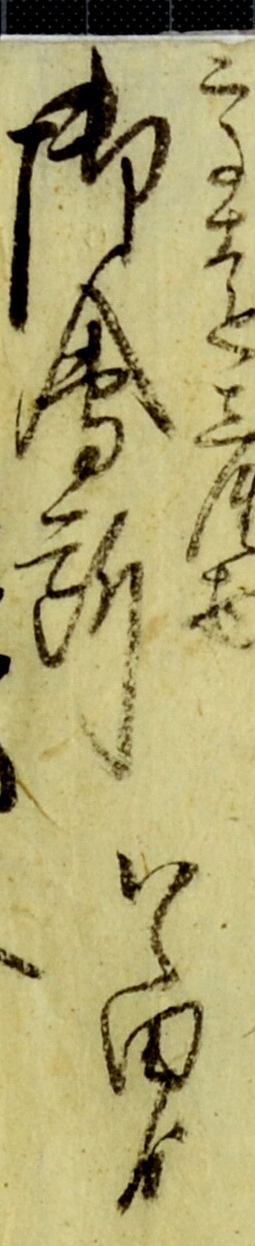御会所いゝ田ゟ

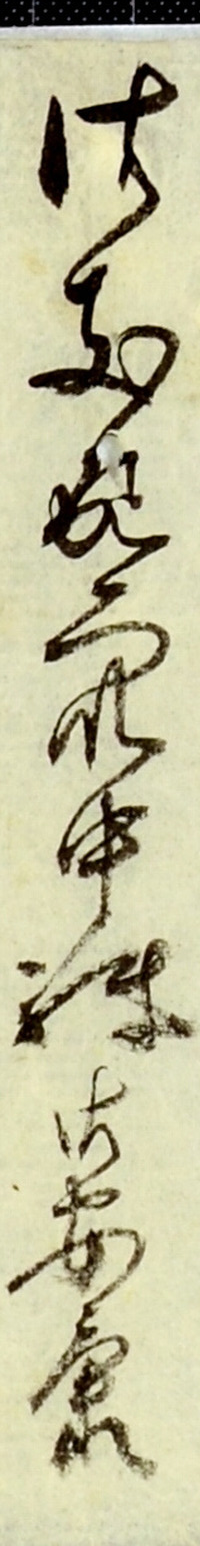御支配衆中様御安気
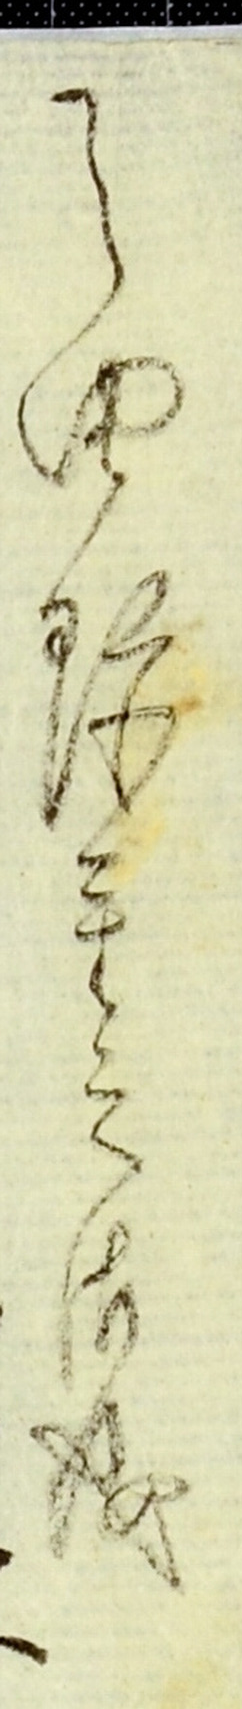之由珍重之御儀
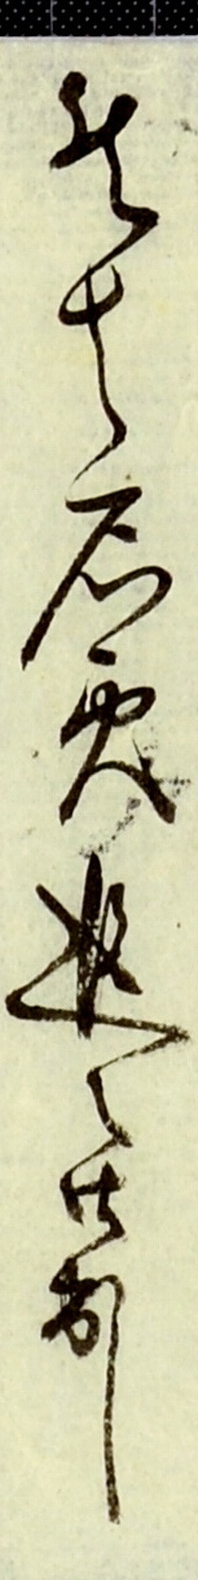然は石灰追々御出し
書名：書状
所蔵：伊那市立高遠町図書館・合同会社AMANE
